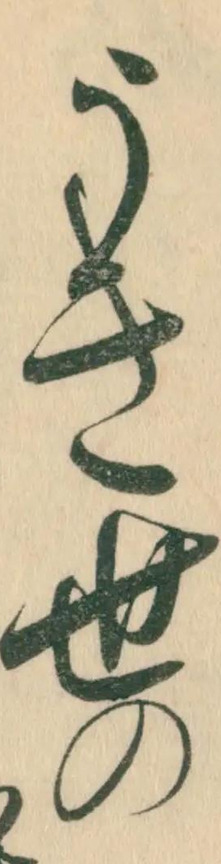うき世の
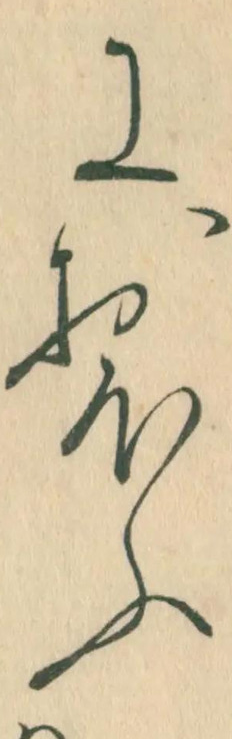におほふ

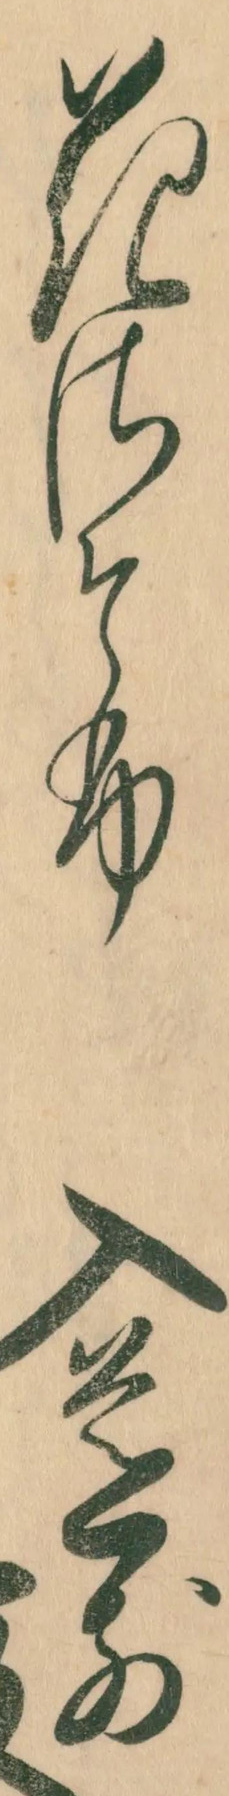花さそふ入道前
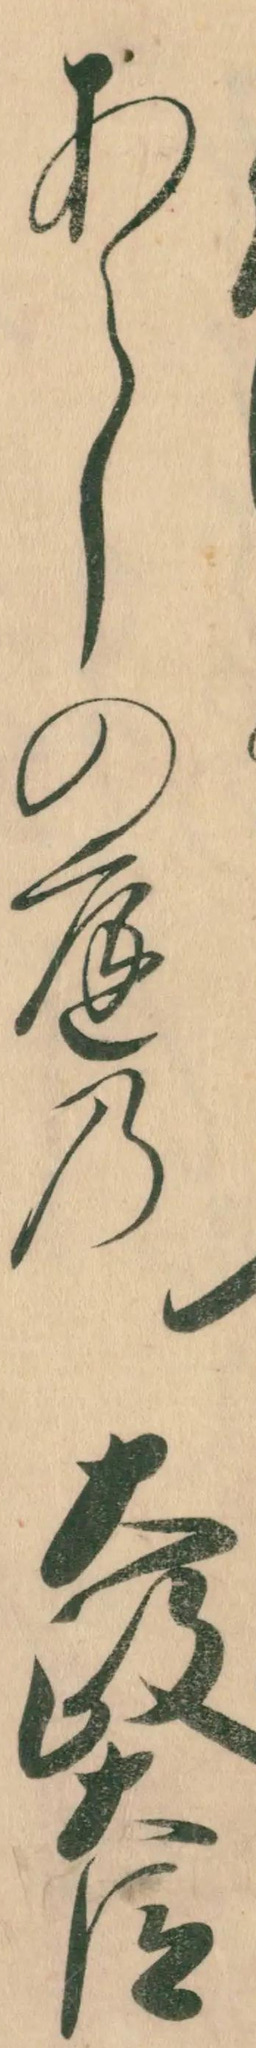あらしの庭の太政大臣
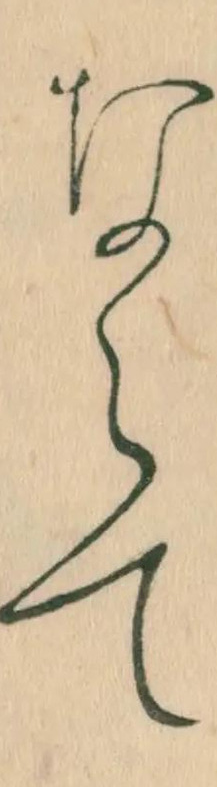ならで
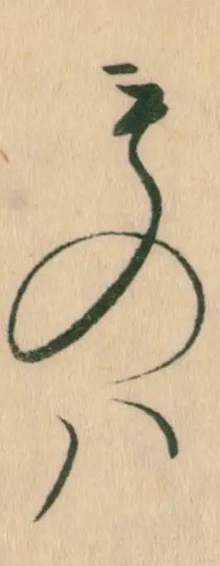ものは
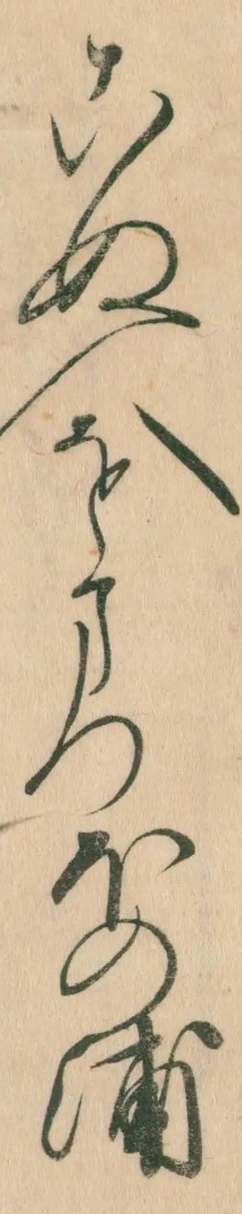こぬ人をまつほの浦
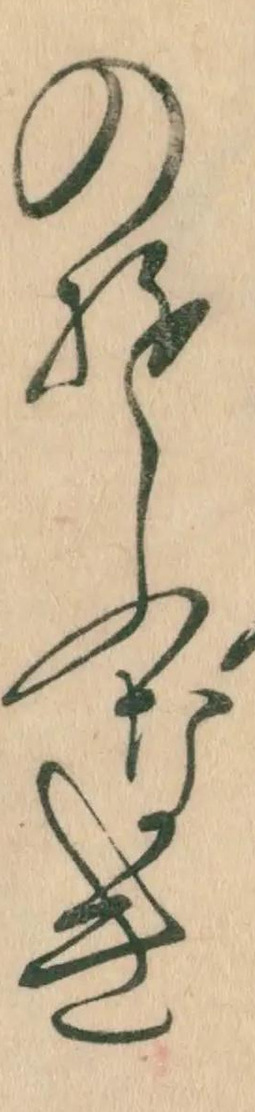のゆふなき
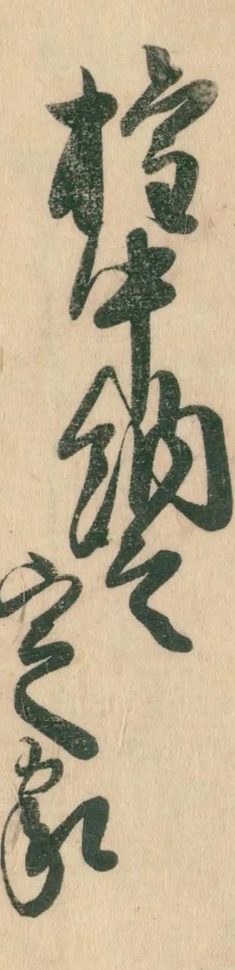權中納言
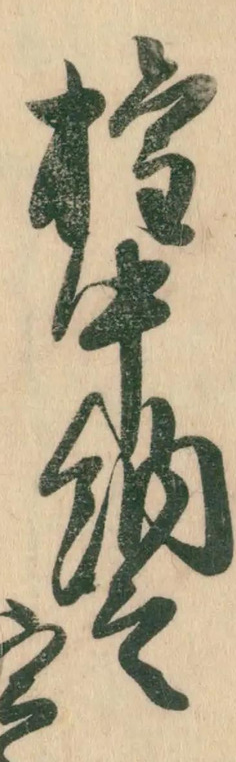權中納言
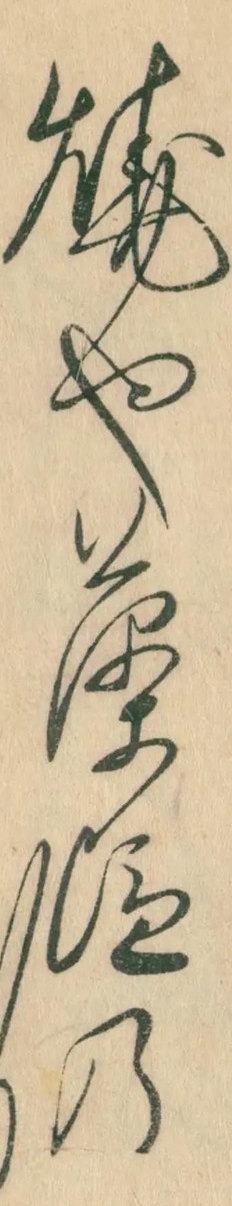焼や藻塩の
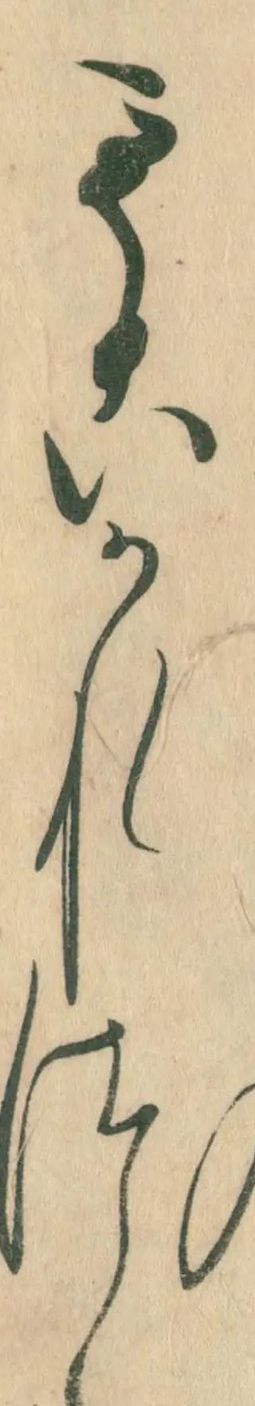もこかれつゝ

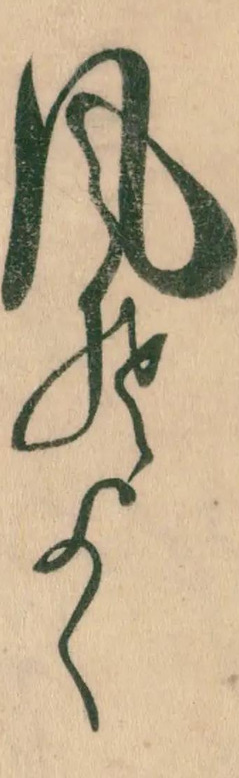風そよく
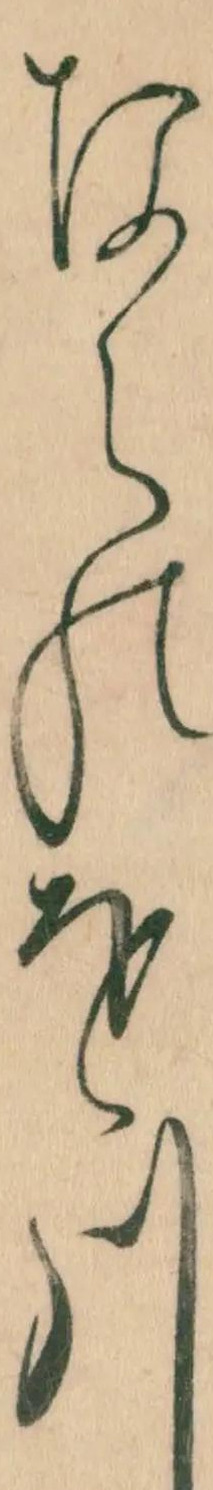ならのを川
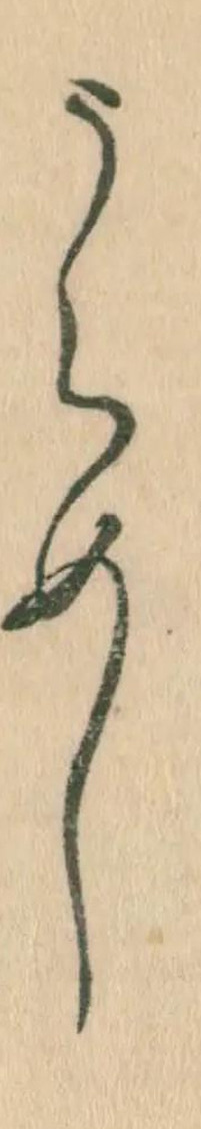うらめし
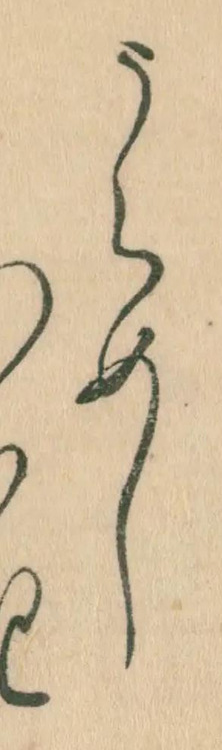うらめし
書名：錦百人一首あつま織
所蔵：国立国会図書館 National Diet Library, JAPAN
